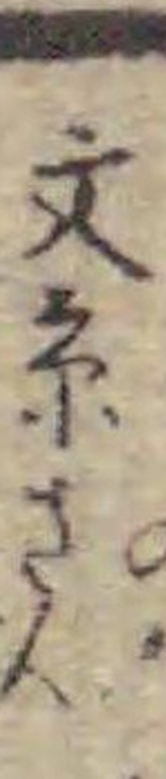文京さん
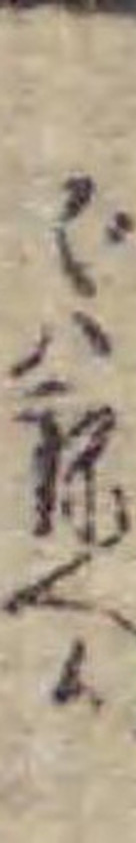ではねへか

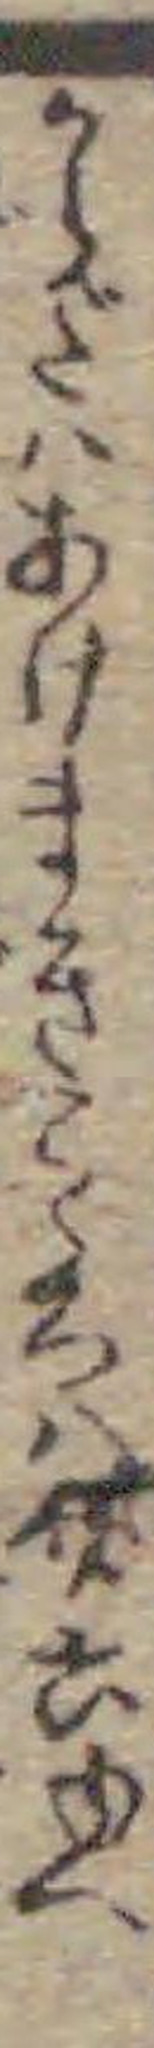からだはあけまきこころは介六ゆへ
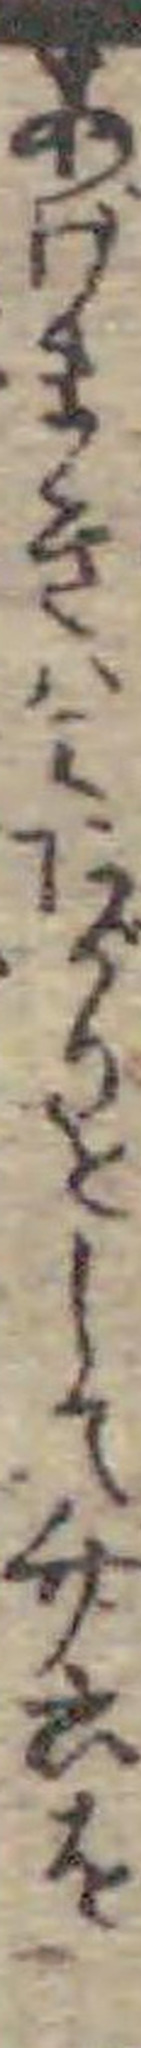あげまきはみあがりをして介六を
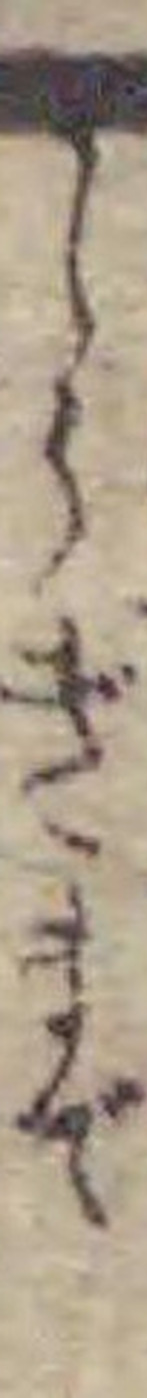しうぎまで
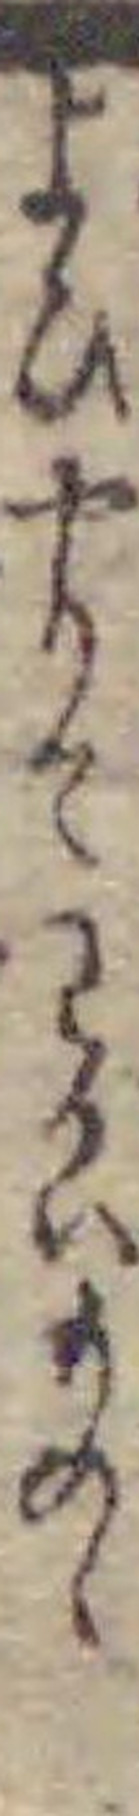よひやりてわかいものゝ
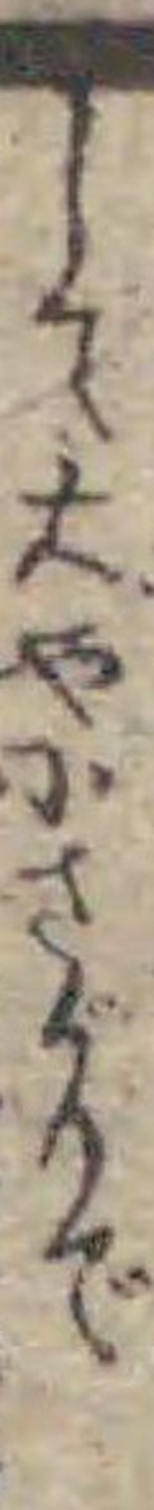して大やにさがりで
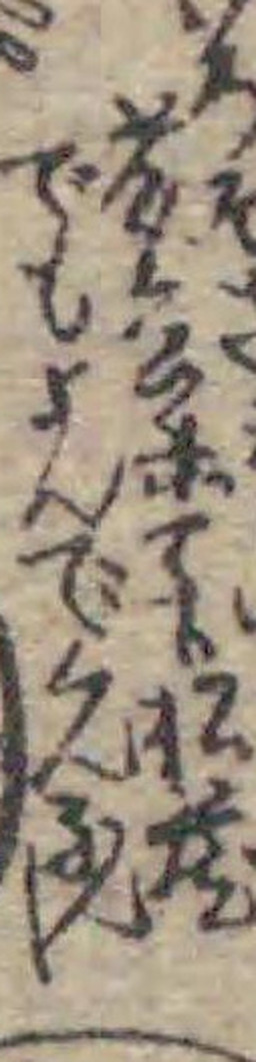でもよんでくんにん
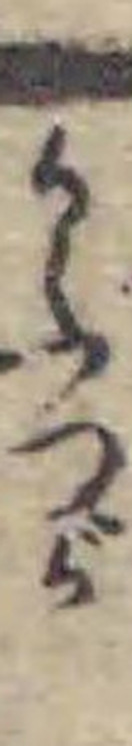かぶつが
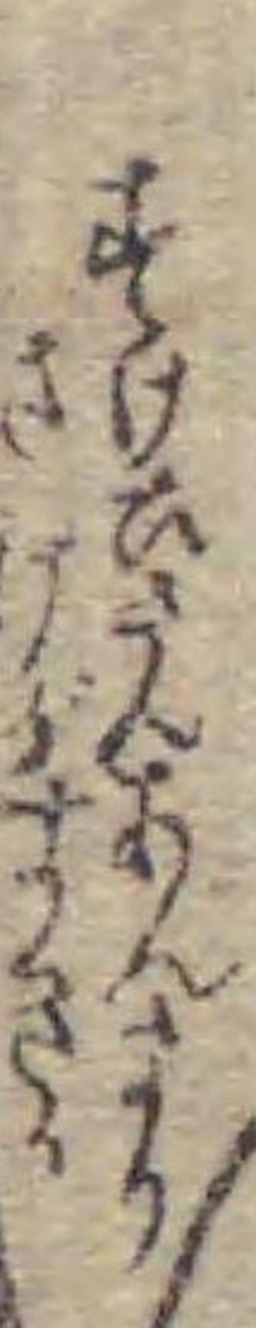さけがすぎる
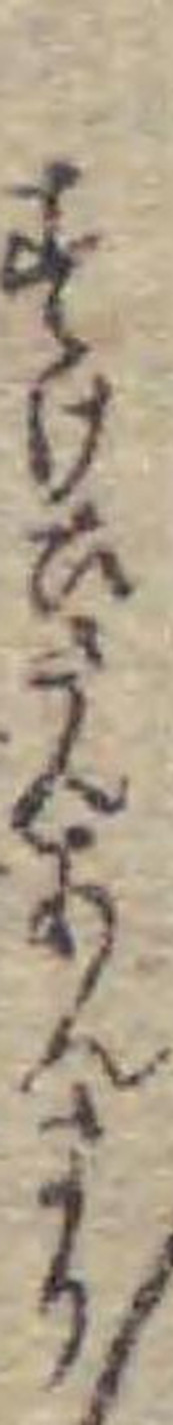すけ六さんあんまり
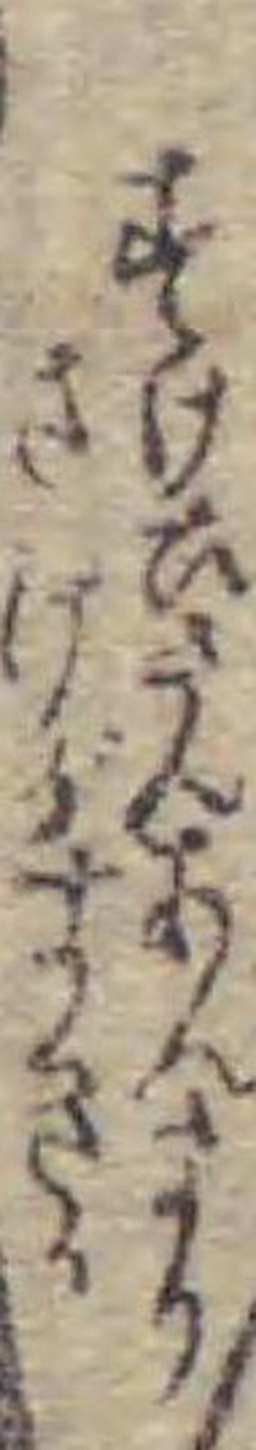さけがすぎる
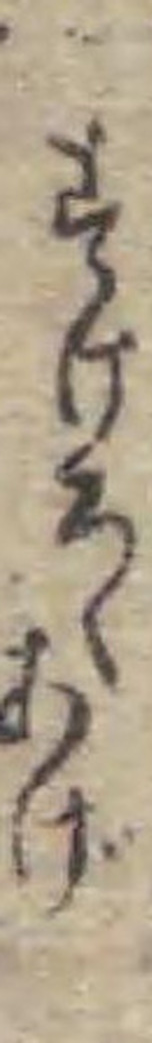すけろくあげ
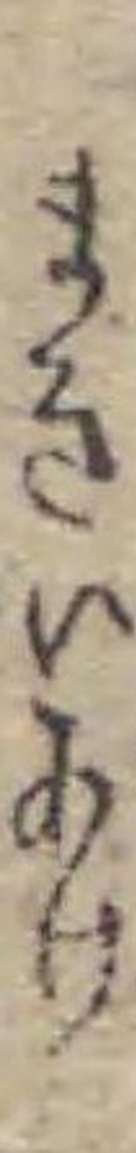まきいあけ
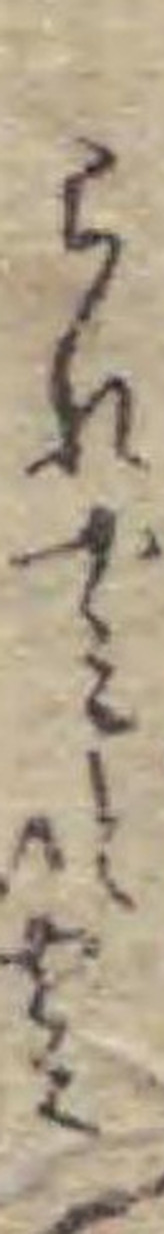られやみといやみ
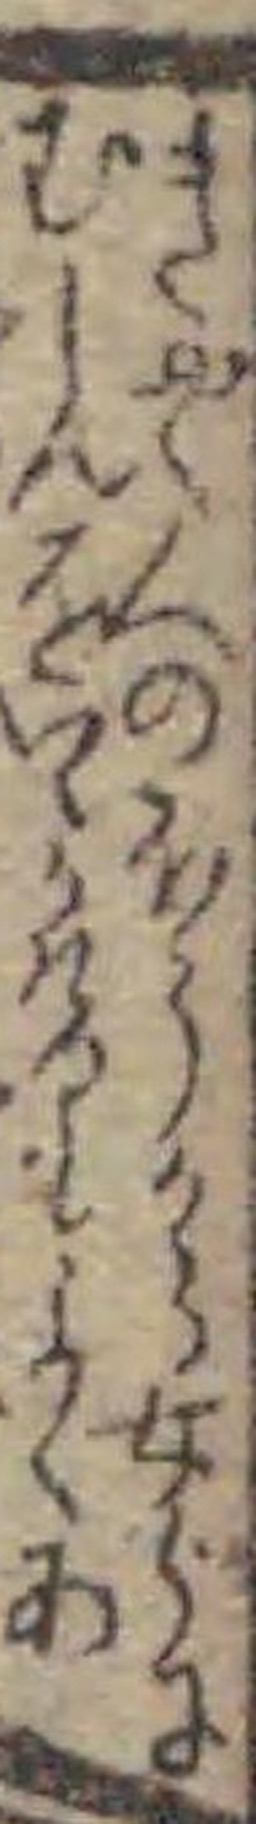むしんをいゝかけるもよくあ
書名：江戸花俳優贔屓 : 3巻
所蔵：国立国会図書館 National Diet Library, JAPAN
